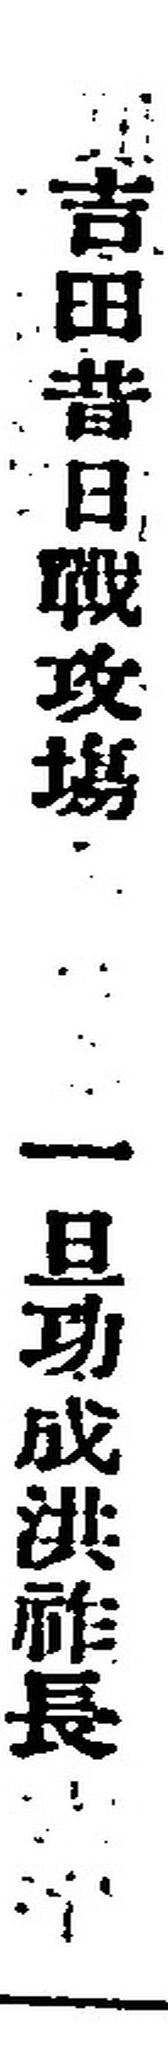吉田昔日戦攻場一旦功成洪祚長
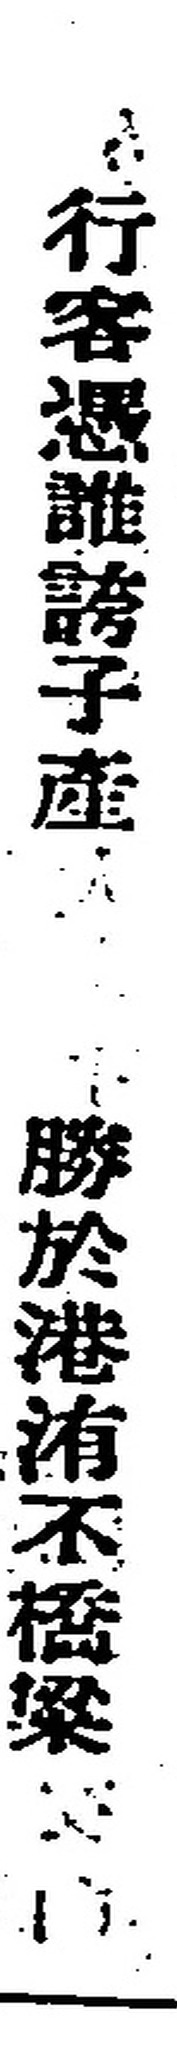行客憑誰誇子産勝於港洧不橋梁
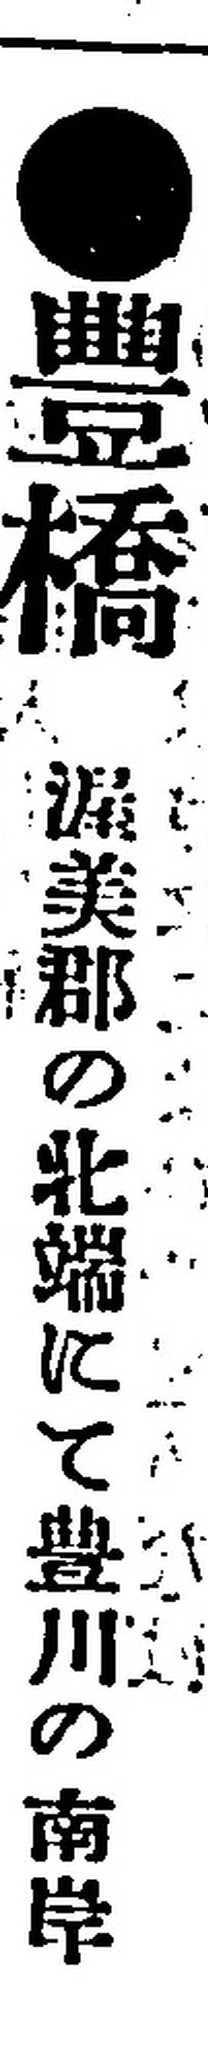●豊橋渥美郡の北端にて豊川の南岸
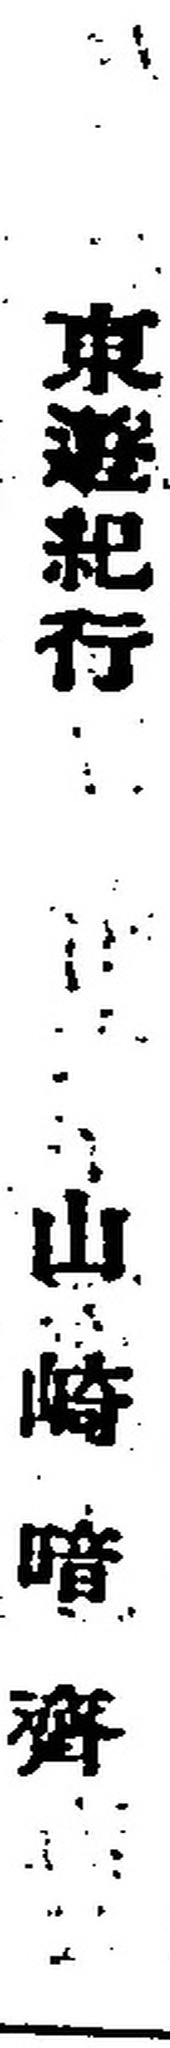東遊紀行山崎暗齋
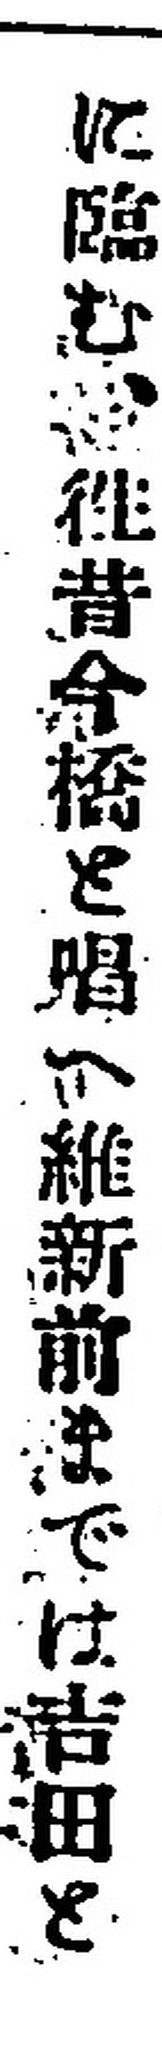に臨む、往昔今橋と唱へ維新前までは吉田と
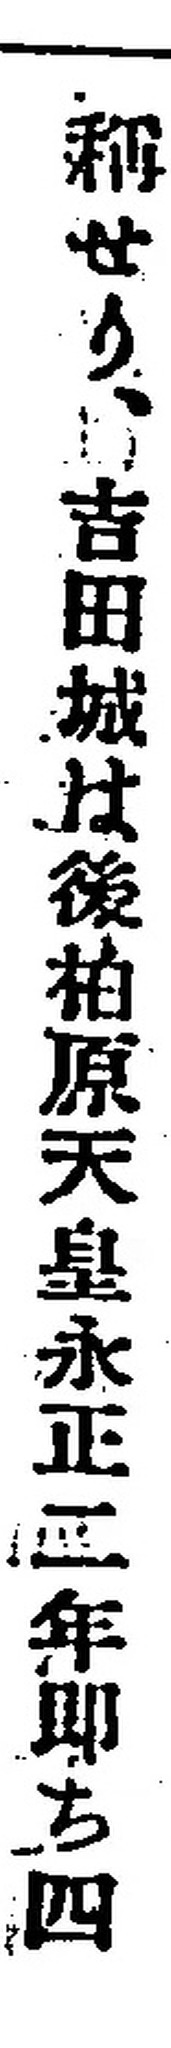称せり、吉田城は後柏原天皇永正二年即ち四
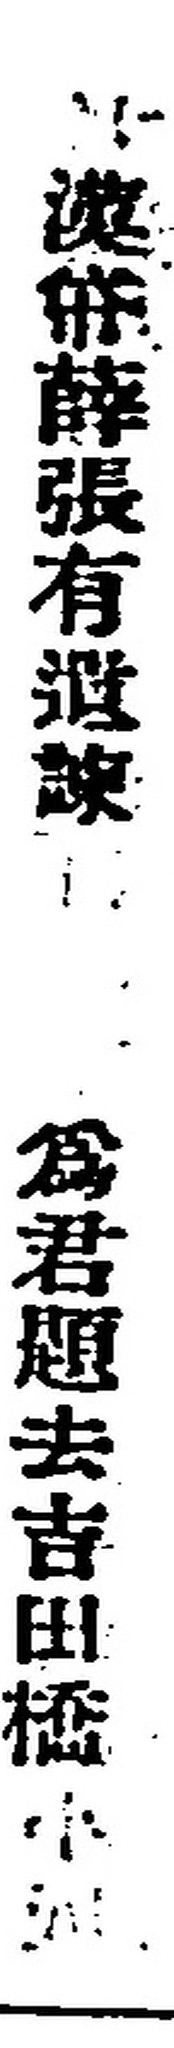漠帒薛張有遺諫為君題去吉田橋
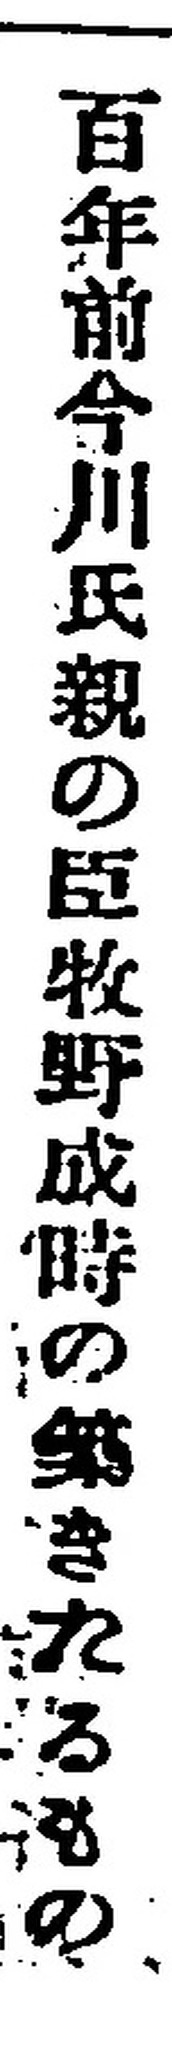百年前今川氏親の臣牧野成時の築きたるもの
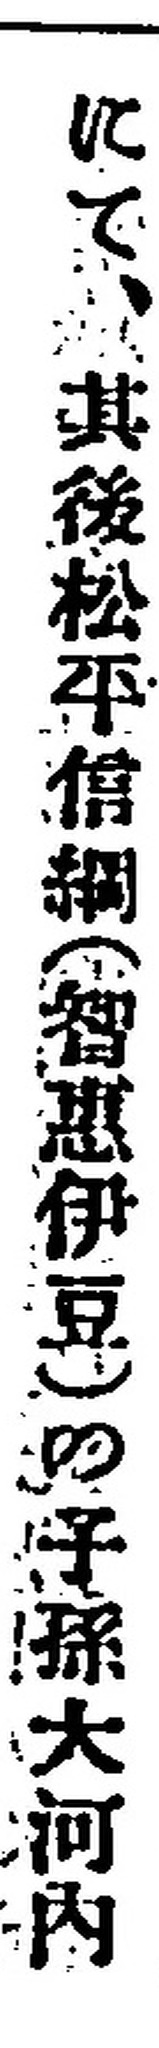にて、其後松平信綱(智恵伊豆)の子孫大河内
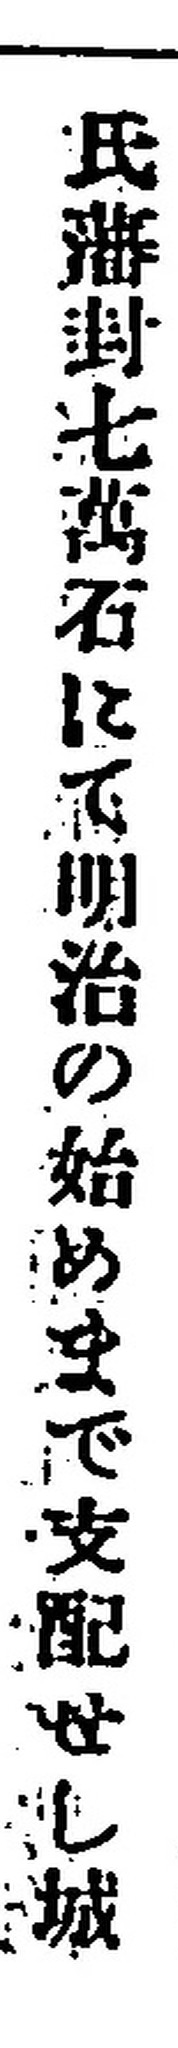氏藩封七万石にて明治の始めまで支配せし城
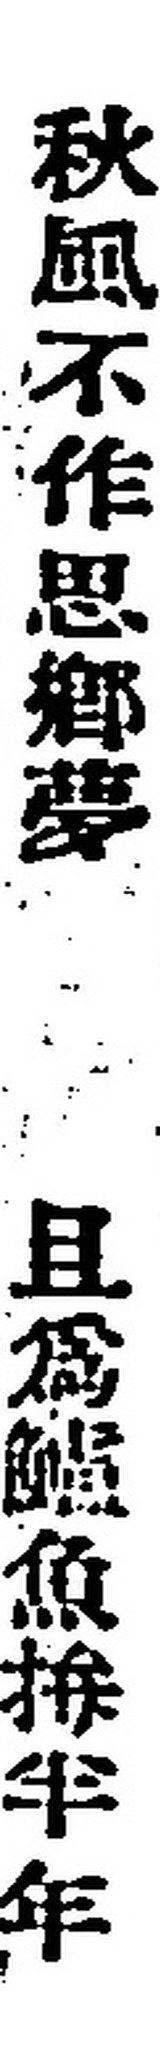秋風不作思郷夢且為鱸魚拚半年
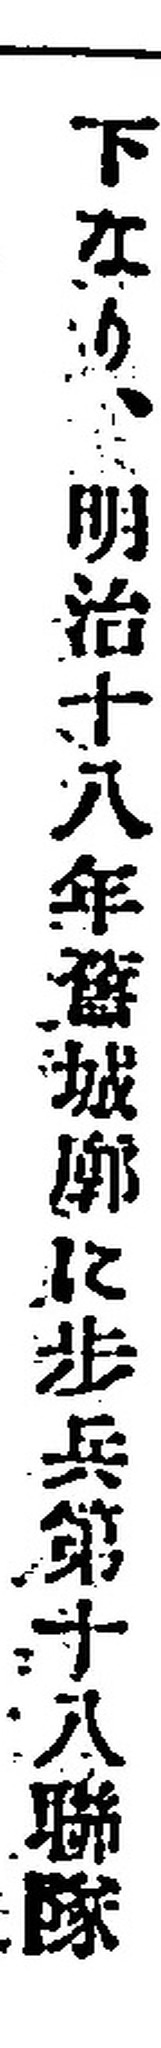下なり、明治十八年旧城廓に歩兵第十八聯隊
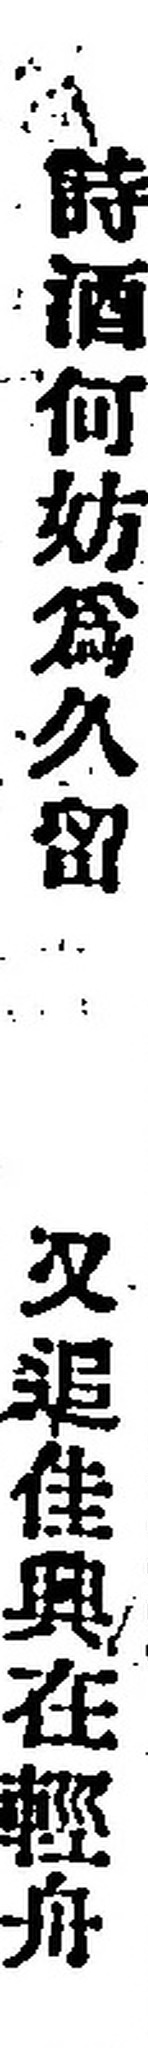詩酒何妨為久留又追佳興在軽舟
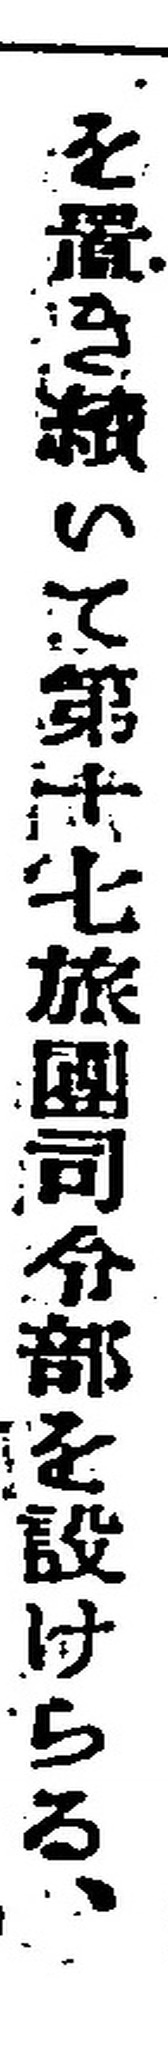を置き続いて第十七旅団司令部を設けらる、
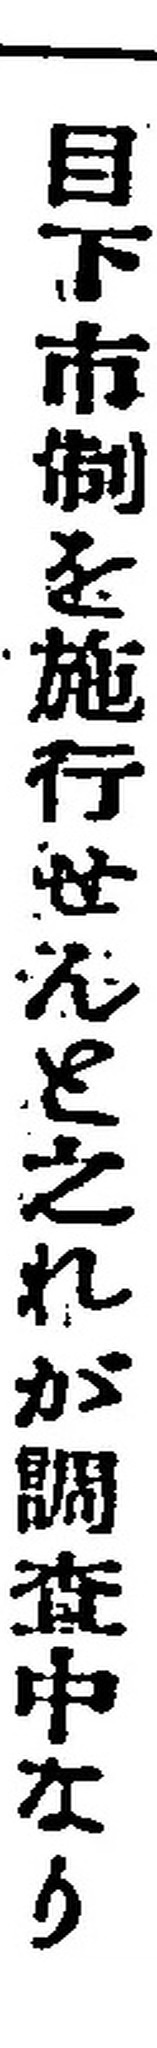目下市制を施行せんと之れが調査中なり
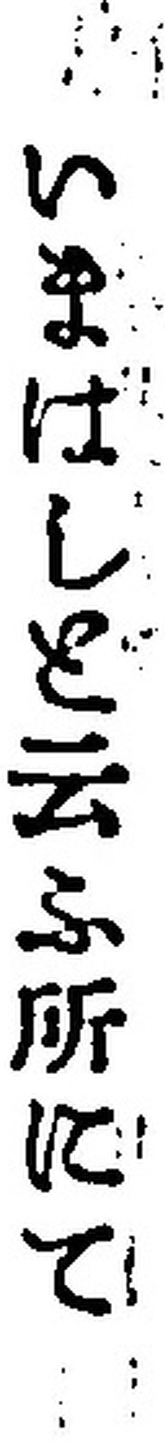いまはしと云ふ所にて
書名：東参名勝案内
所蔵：国立国会図書館 National Diet Library, JAPAN
